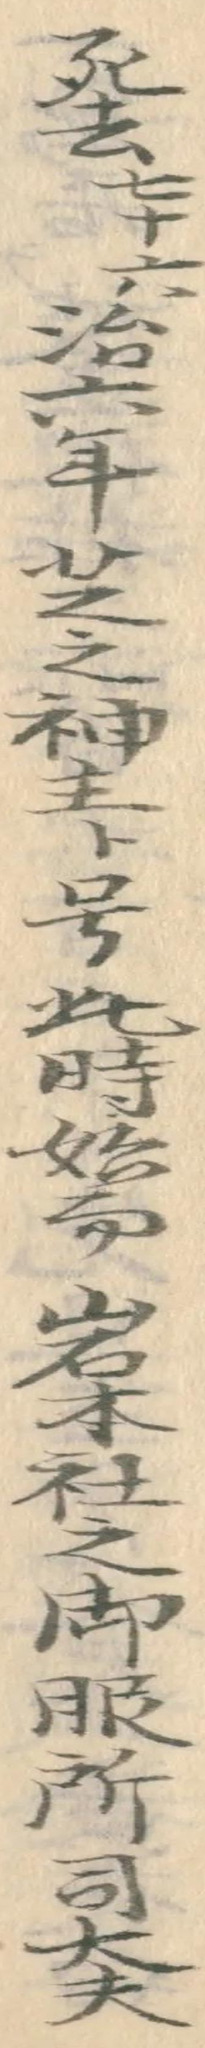死去七十六治六年芝之神主ト号此時始而岩本社之御服所司大夫
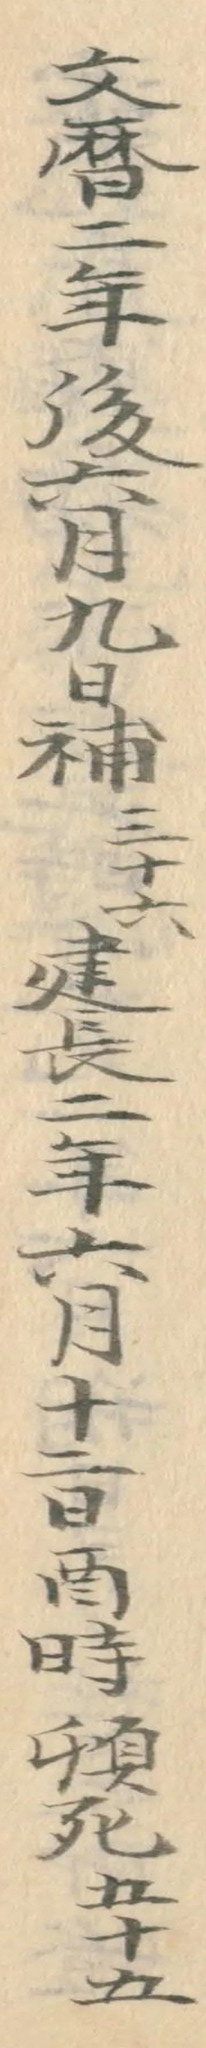文暦二年後六月九日補三十六建長二年六月十二日酉時頓死五十五

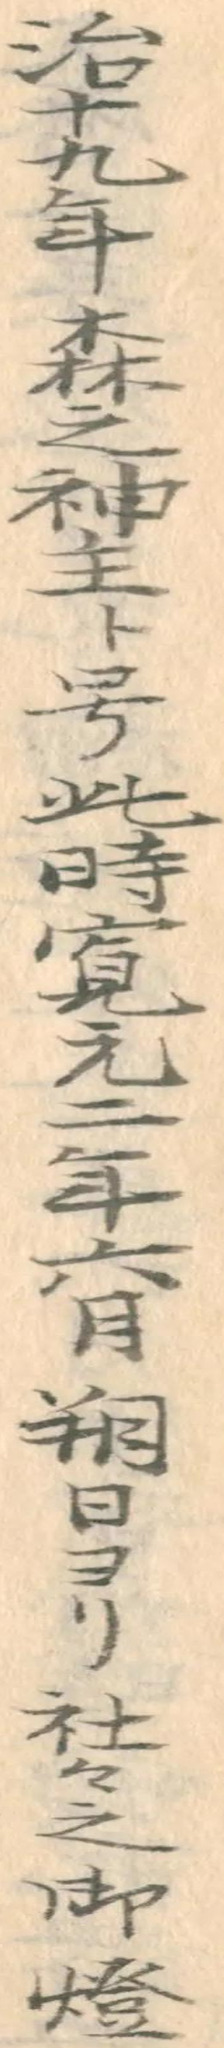治十九年森之神主ト号此時寛元二年六月朔日ヨリ社々之御燈
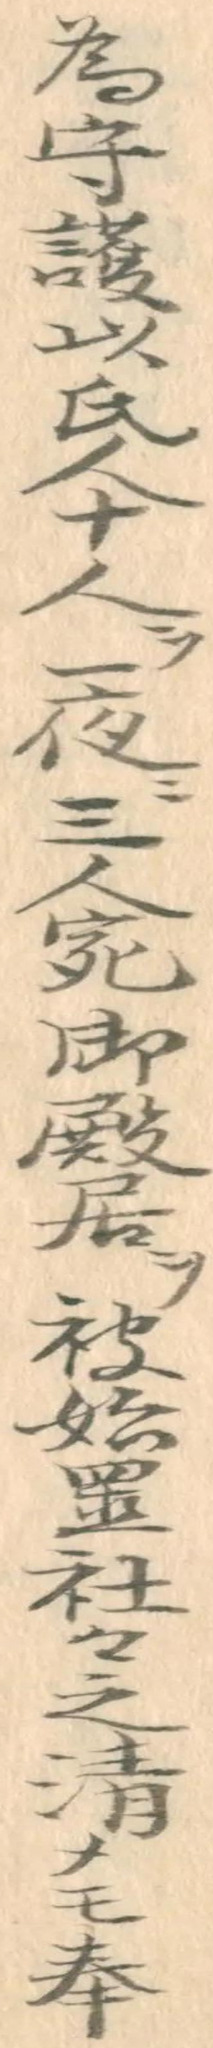為守護以氏人十人ヲ一夜ニ三人宛御殿居ヲ被始置社々之清メモ奉
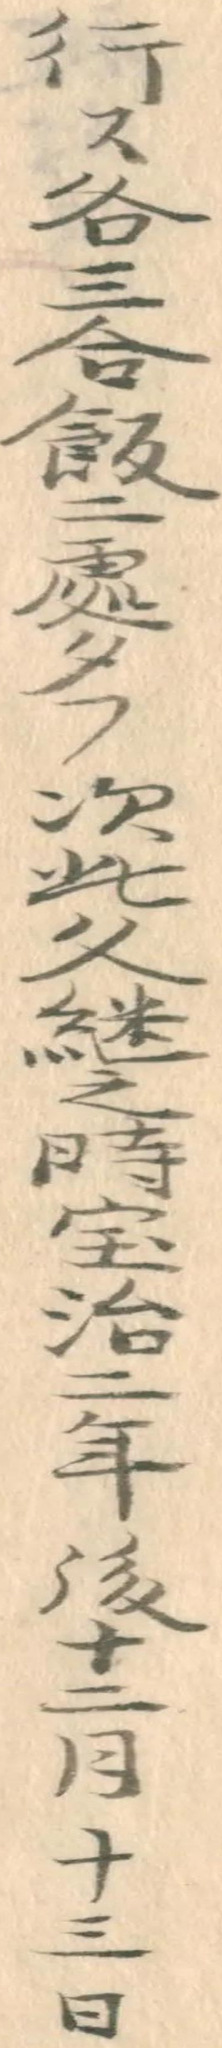行ス各三合飯二処夕フ次此久継之時宝治二年後十二月十三日
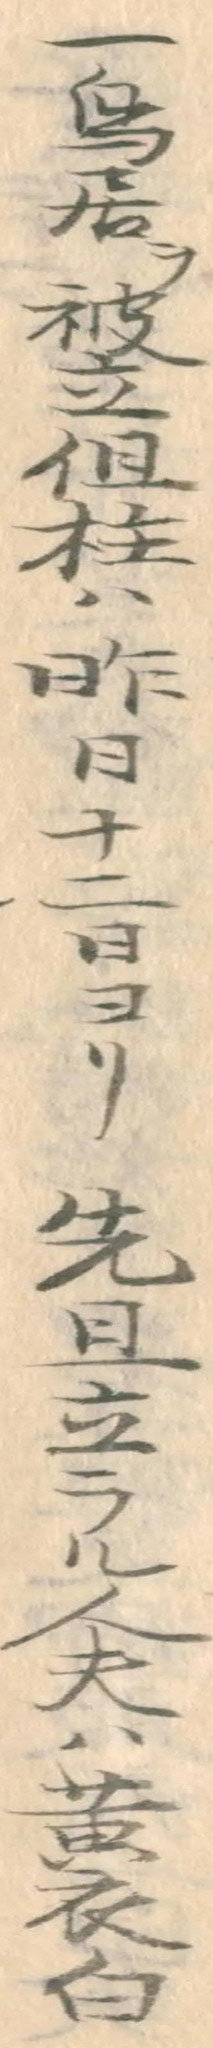一鳥居ヲ被立但柱ハ昨日十二日ヨリ先且立ラル人夫ハ黄衣白
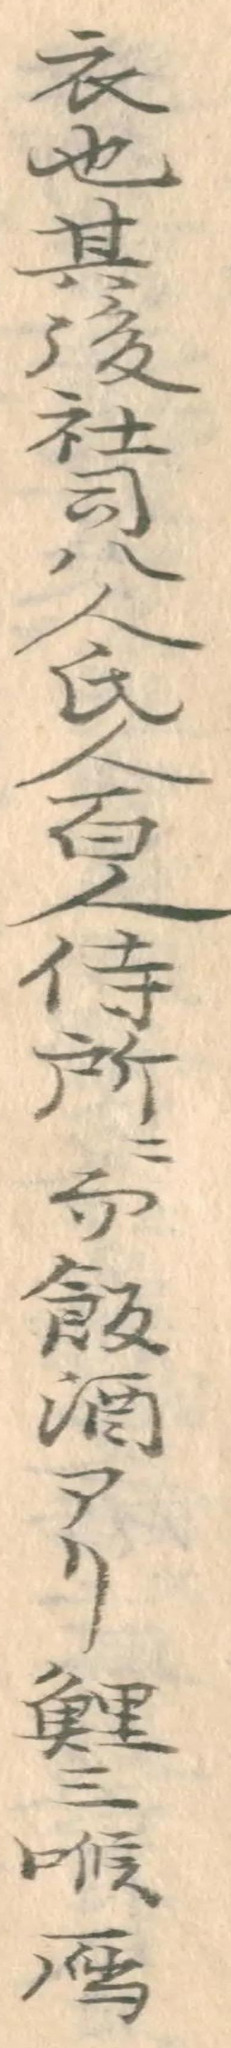衣也其後社司八人氏人百人侍所ニ而飯酒アリ鯉三喉鷹
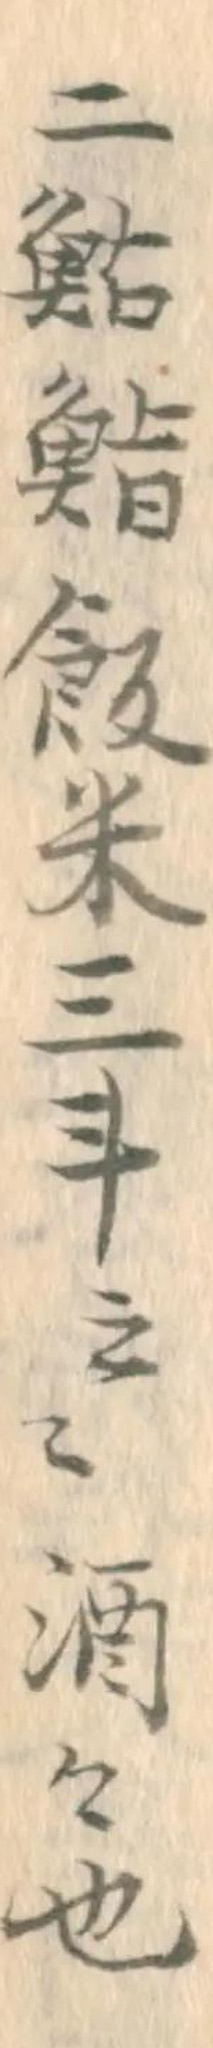二鮎鮨飯米三斗云々酒々也
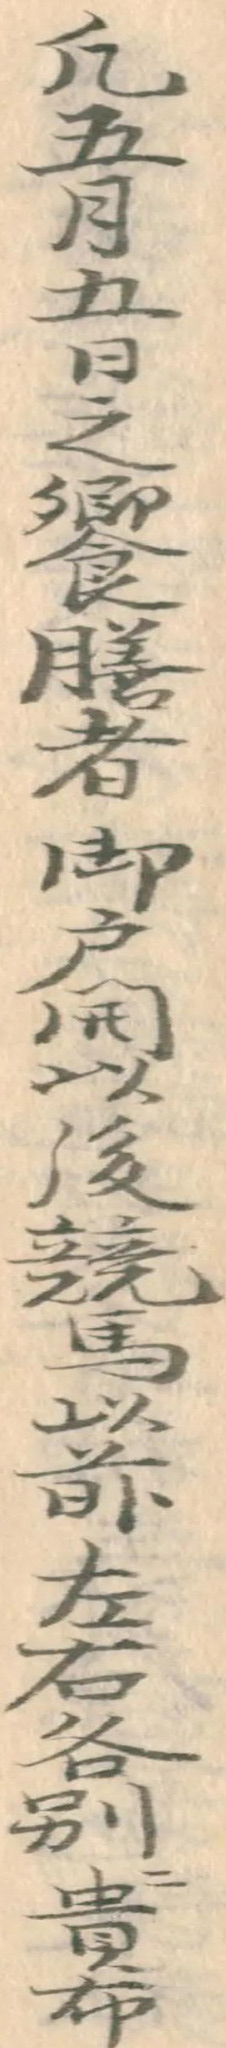凡五月五日之饗膳者御戸開以後競馬以前左右各別ニ貴布
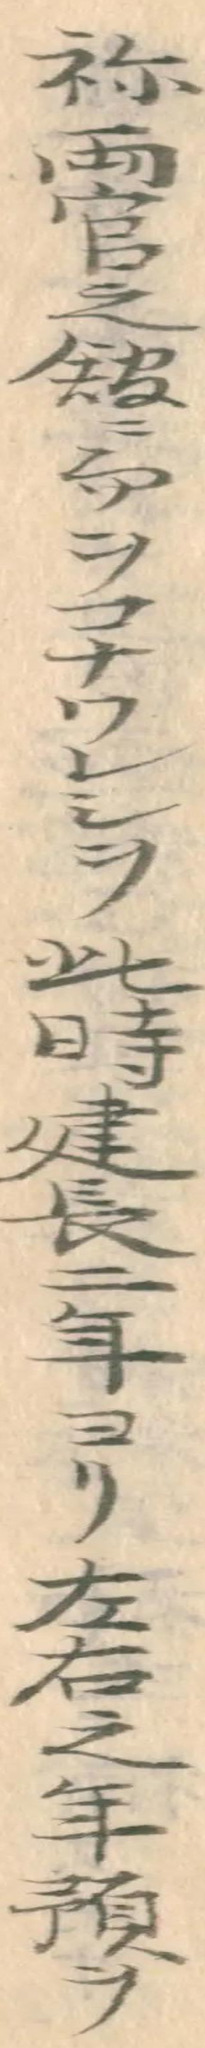祢両官之館ニ而ヲコナワレシヲ此時建長二年ヨリ左右之年預ヲ
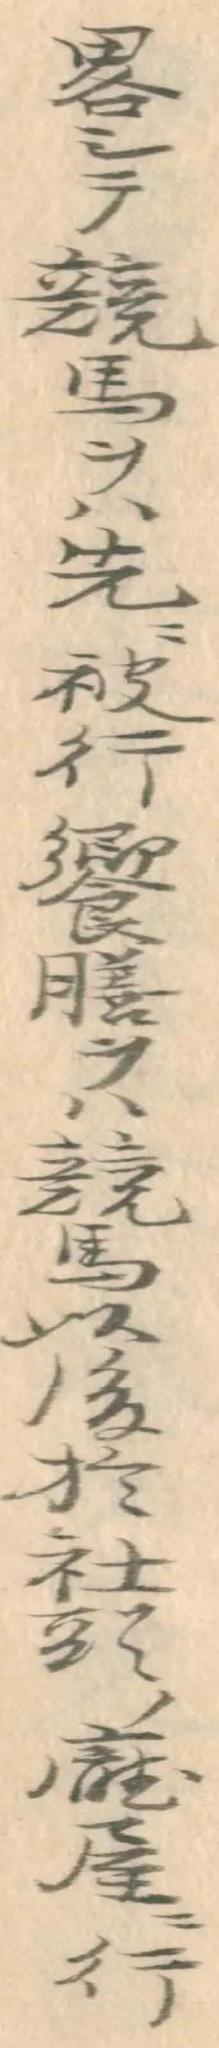略シテ競馬ヲハ先ニ被行饗膳ヲハ競馬以後於社頭ノ庁屋ニ行
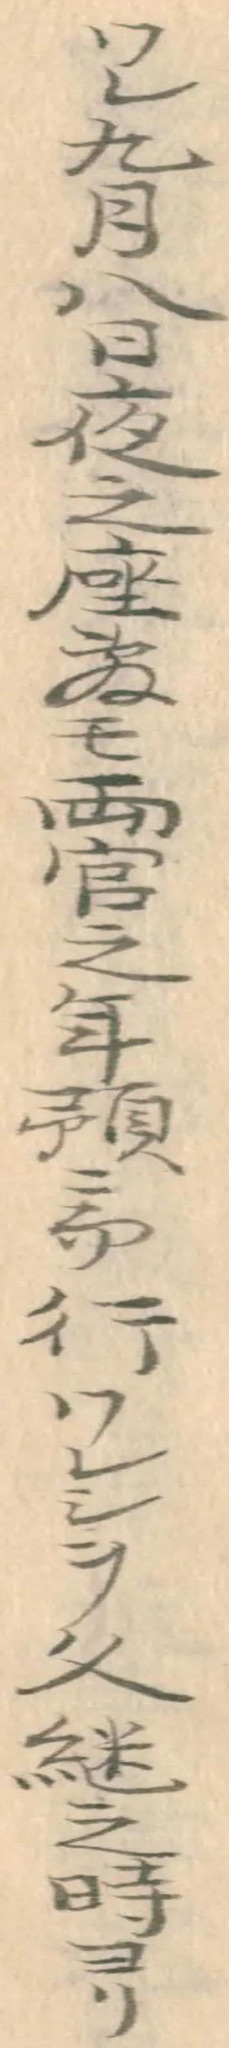ワレ九月八日夜之座敷モ両宮之年預ニ而行ワレシヲ久継之時ヨリ
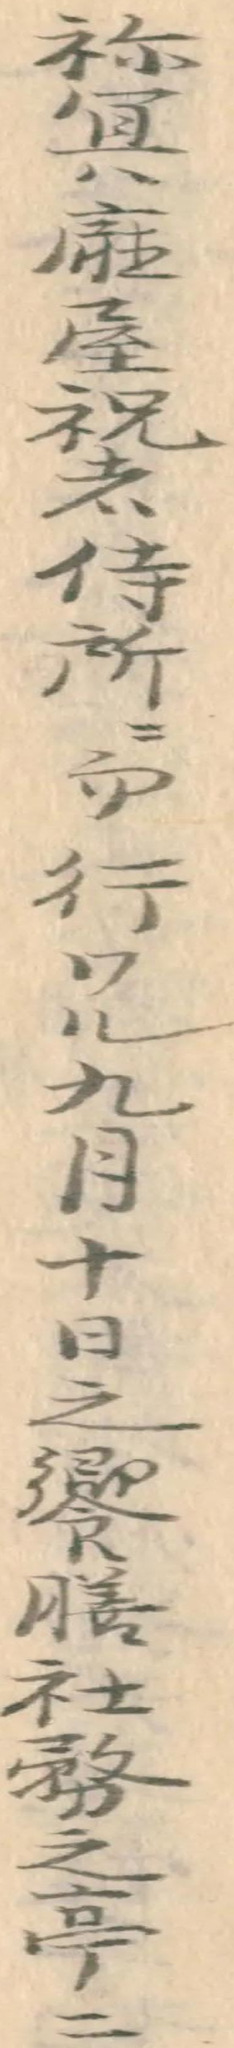祢宜ハ庁屋祝者侍所ニ而行ワル九月十日之饗膳社務之亭ニ
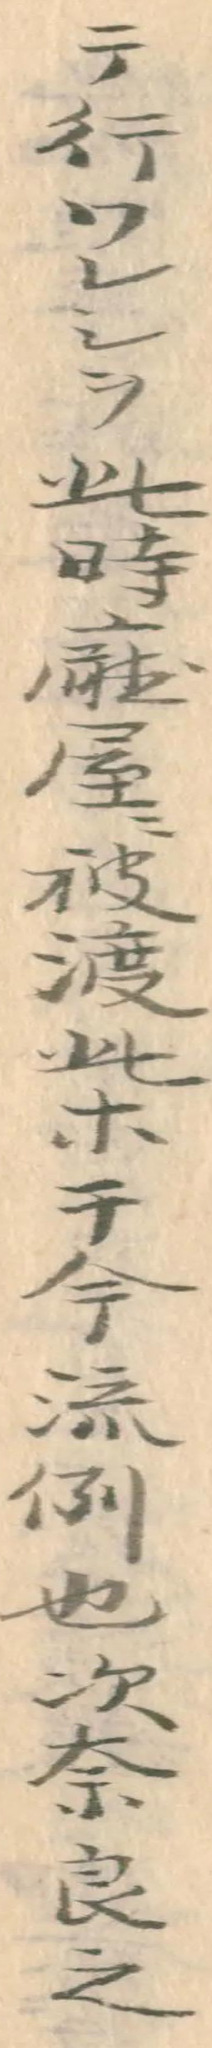テ行ワレシヲ此時庁屋ニ被渡此等于今流例也次奈良之
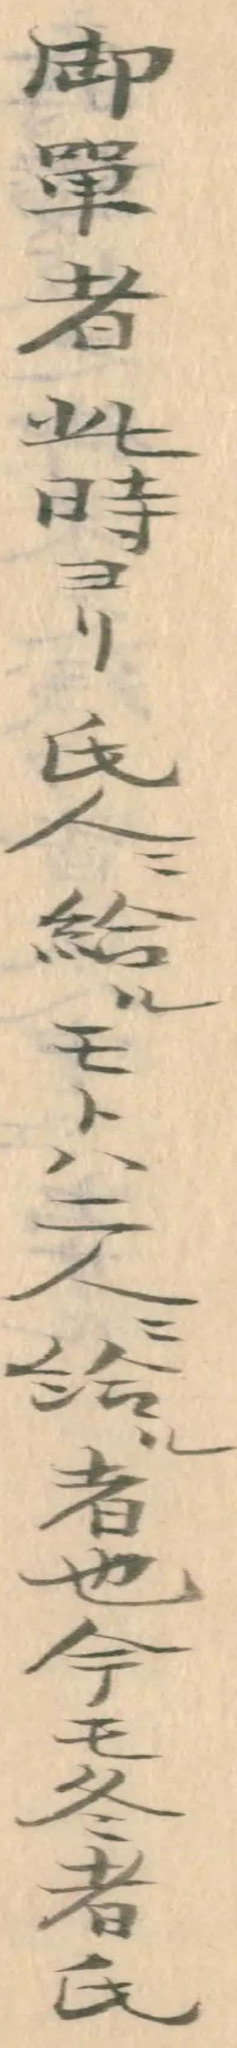御単者此時ヨリ氏人ニ給ルモトハ二人ニ給ル者也今モ冬者氏
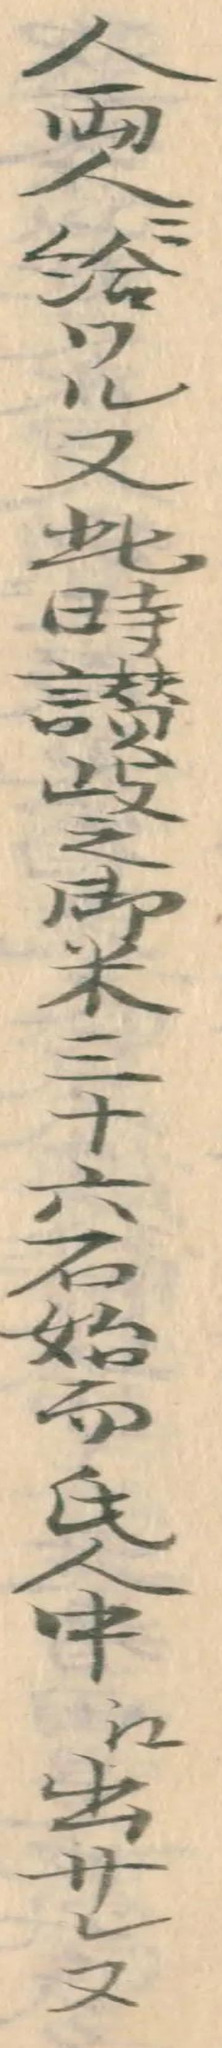人両人ニ給ワル又此時讃岐之御米三十六石始而氏人中江出サレヌ
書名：賀茂社記録. 第24冊
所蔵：国立国会図書館 National Diet Library, JAPAN
